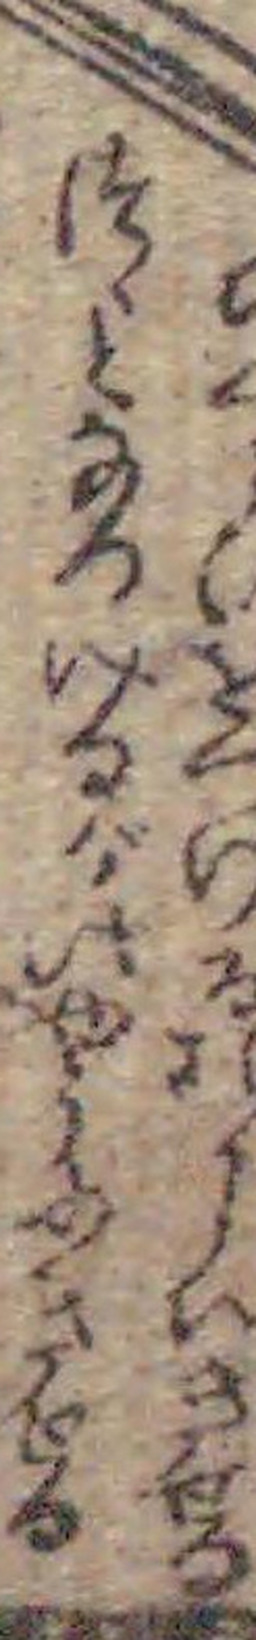つゝとなつけるが此やうにきせる
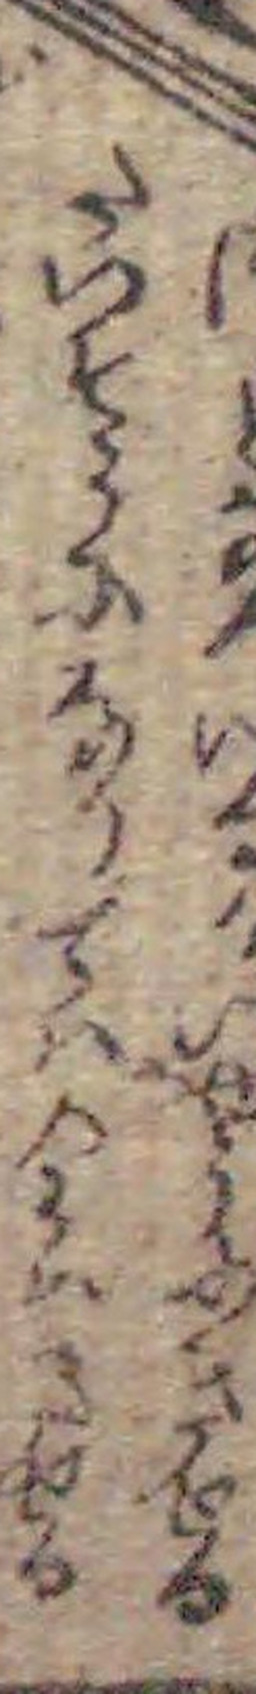たいそうになりては今はきせる
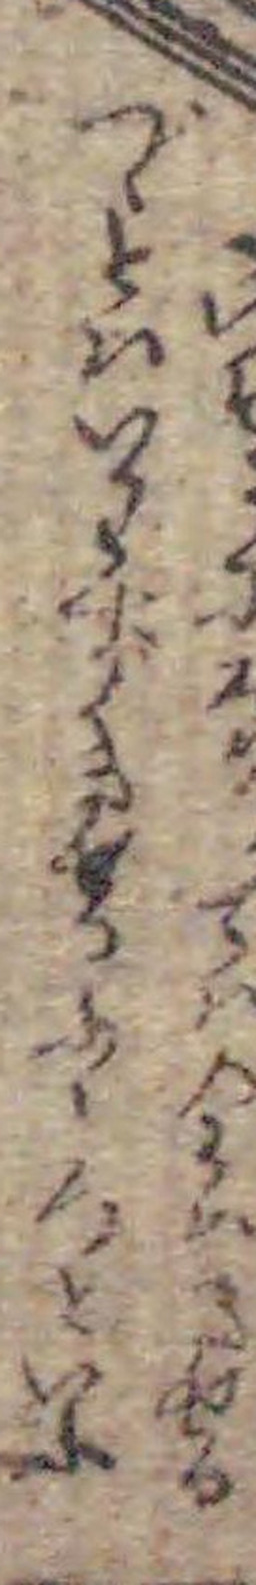づゝとはいわずきせるふくろといふ
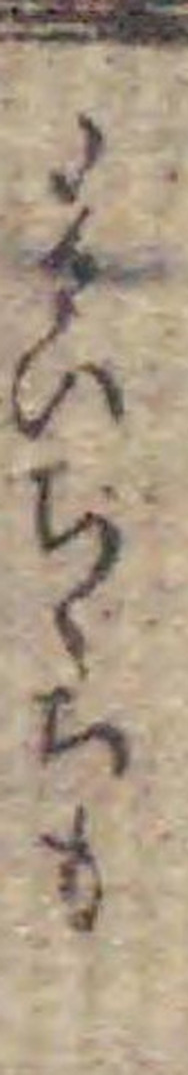わるいぢくちも
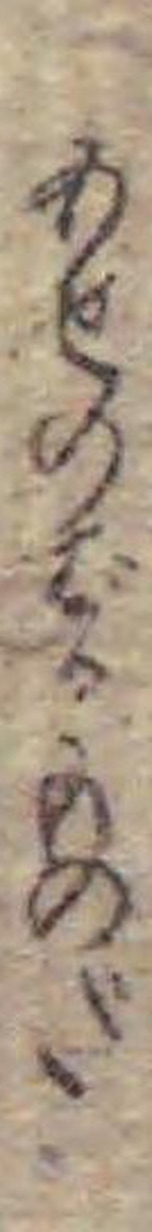あせのでるものだ
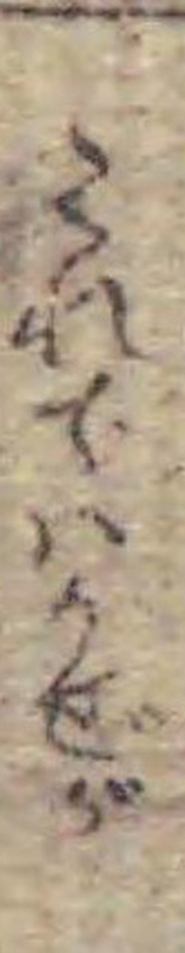これではかぜが
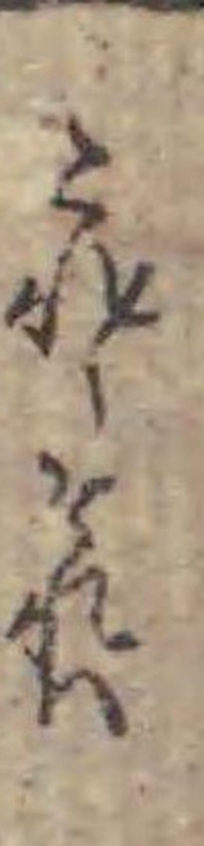これ〳〵それは
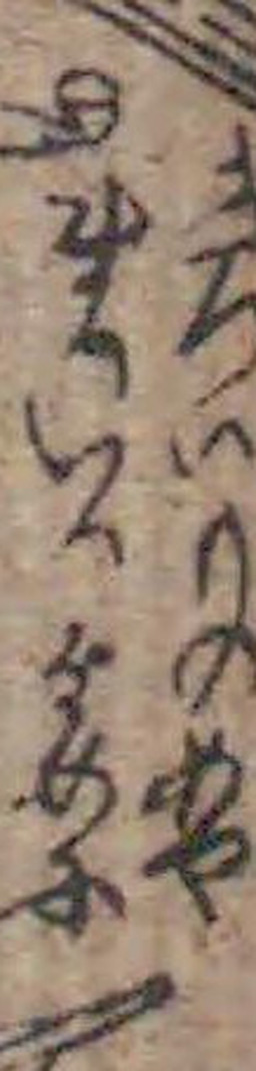まりいるるめに
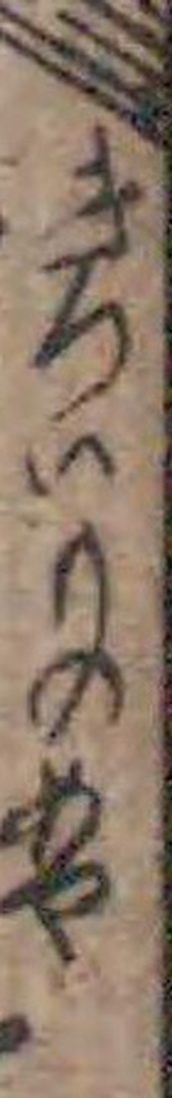きついものあや
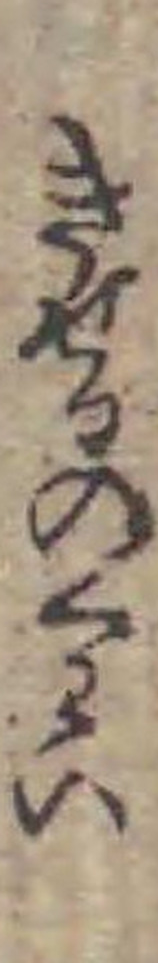きせるのくわい
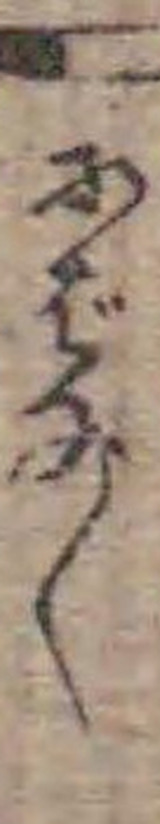にばな〳〵
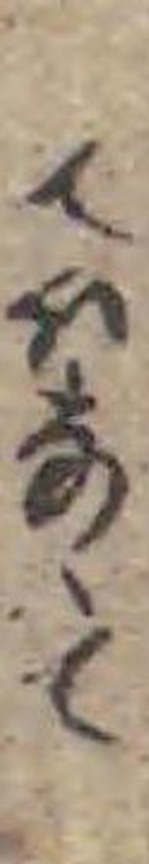てはなくて
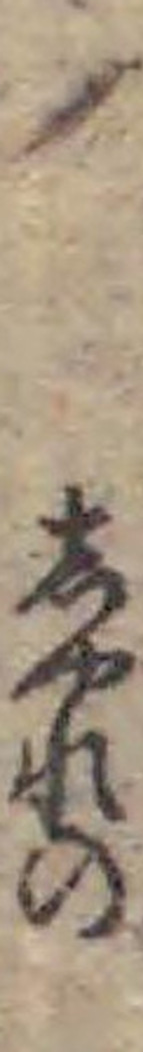しやれの
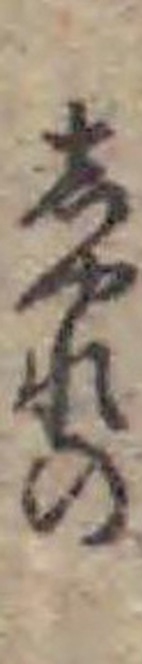しやれの
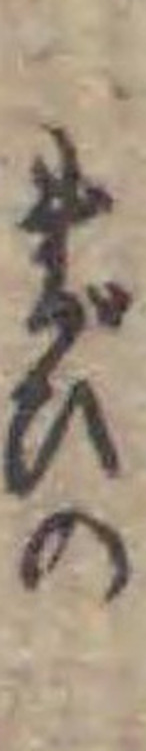まがひの
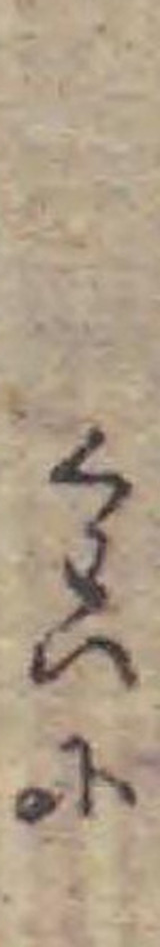くわいに
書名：威気千代牟物語 : 2巻
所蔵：国立国会図書館 National Diet Library, JAPAN
